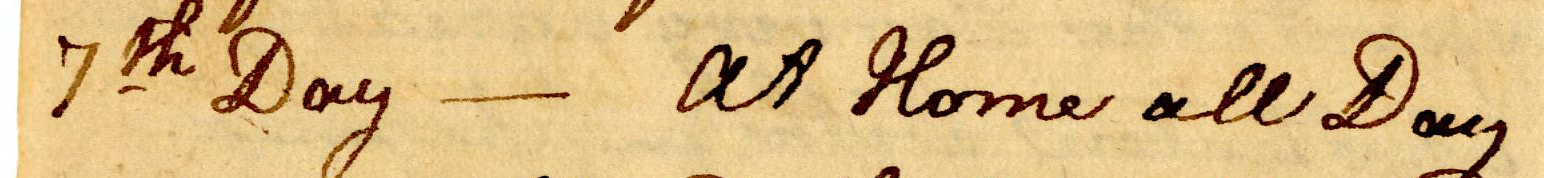7^th Day- At Home all Day
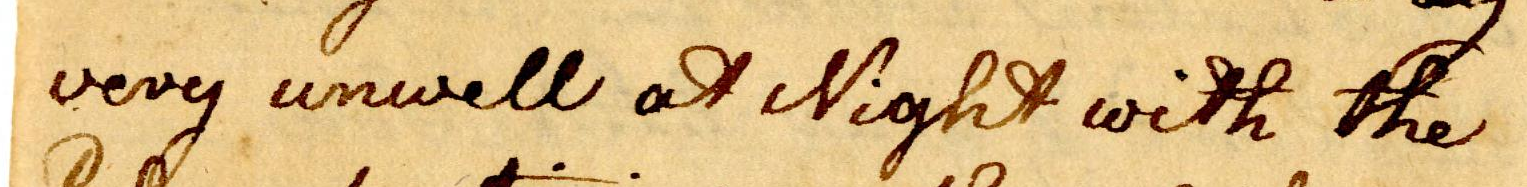very unwell at Night with the
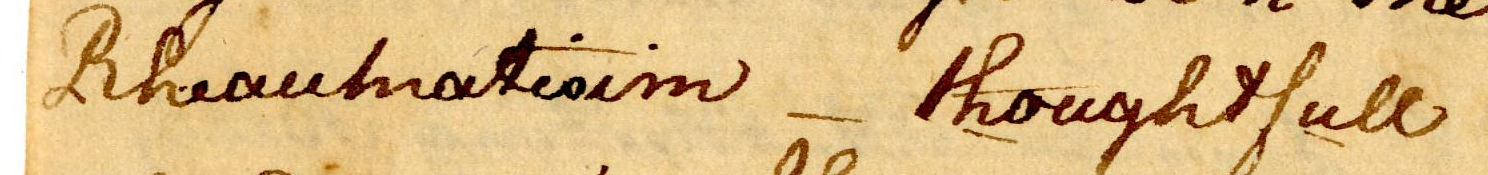Rheaumatisim- thoughtfull
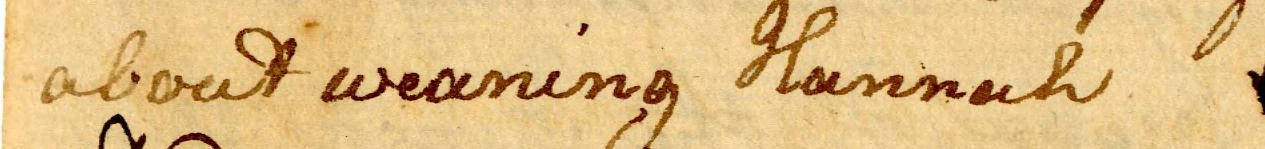about weaning Hannah
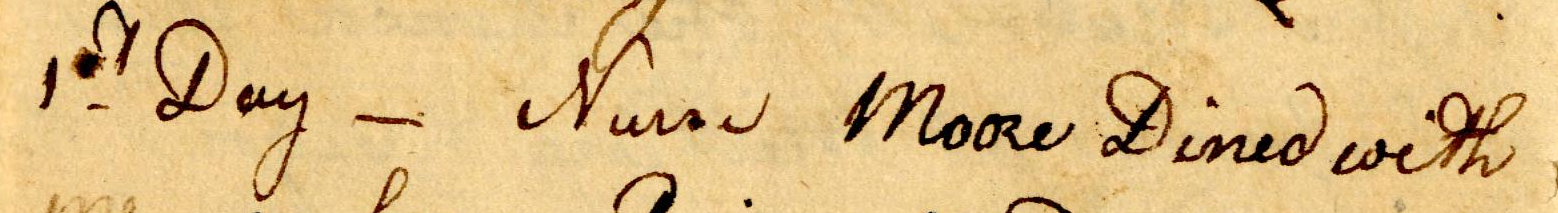1^st Day- Nurse Moore Dined with
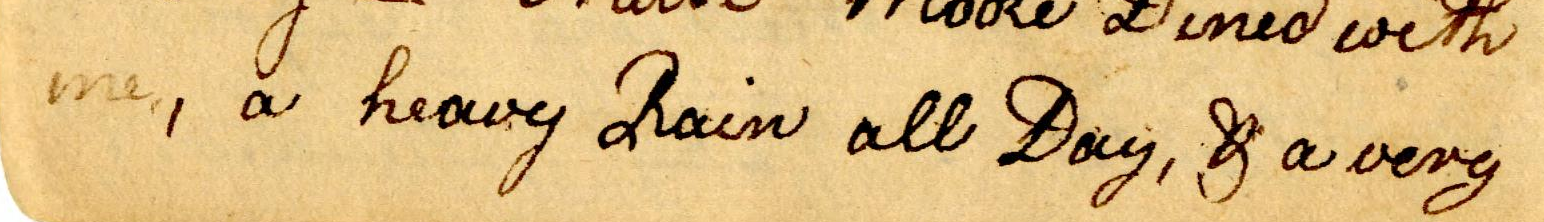me, a heavy Rain all Day & a very
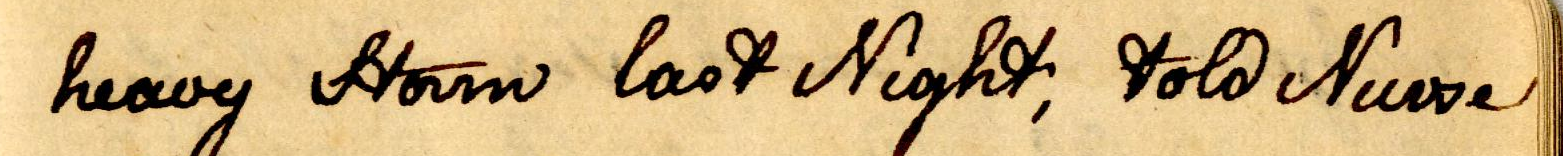heavy Storm last Night, told Nurse
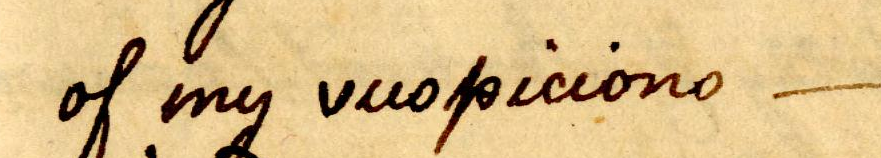of my suspicions-
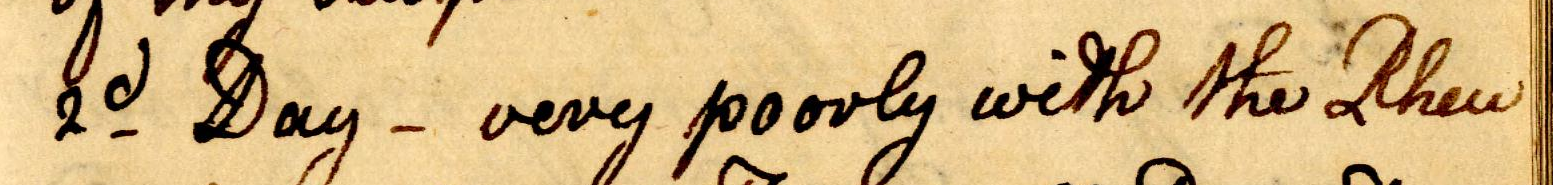2^d. Day- very poorly with the Rheu
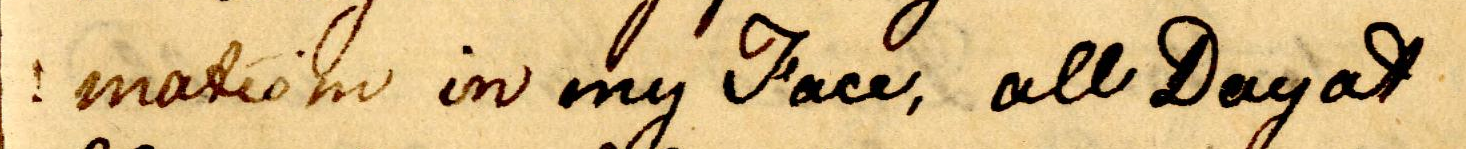-matism in my Face, all Day at
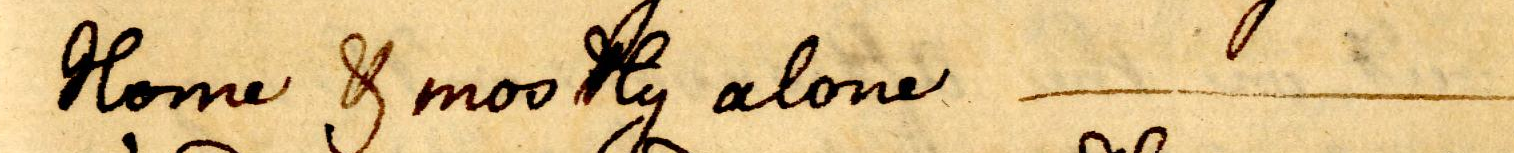Home & mostly alone-
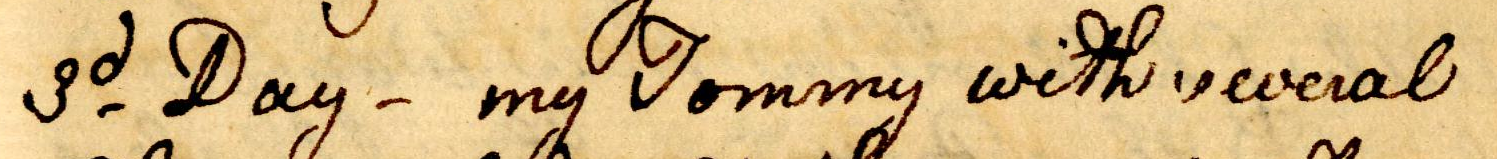3^d. Day- my Tommy with several
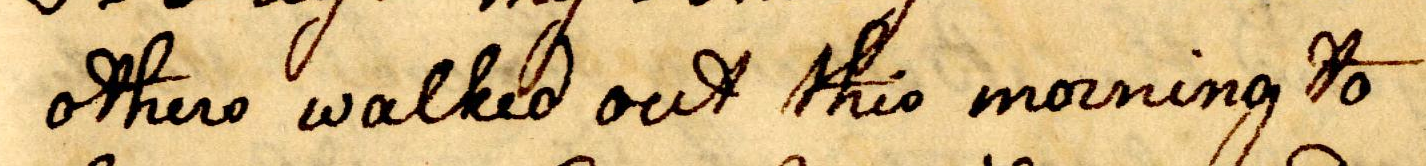others walked out this morning to
